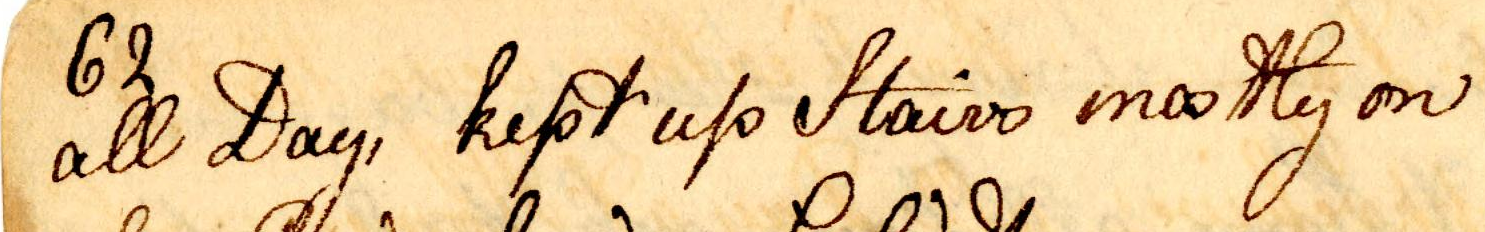all Day, kept up Stairs mostly on
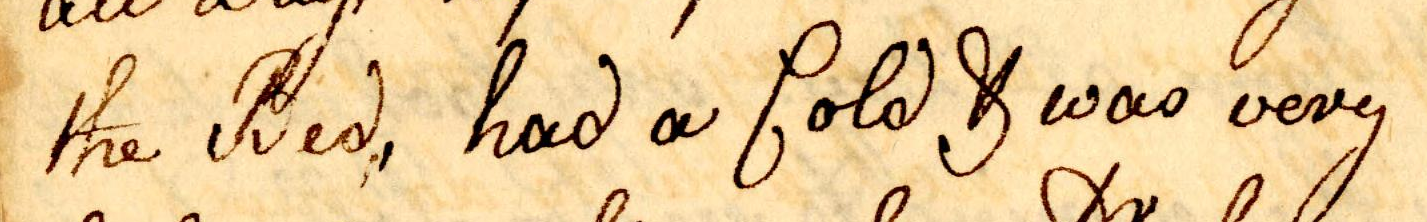the Bed, had a Cold & was very
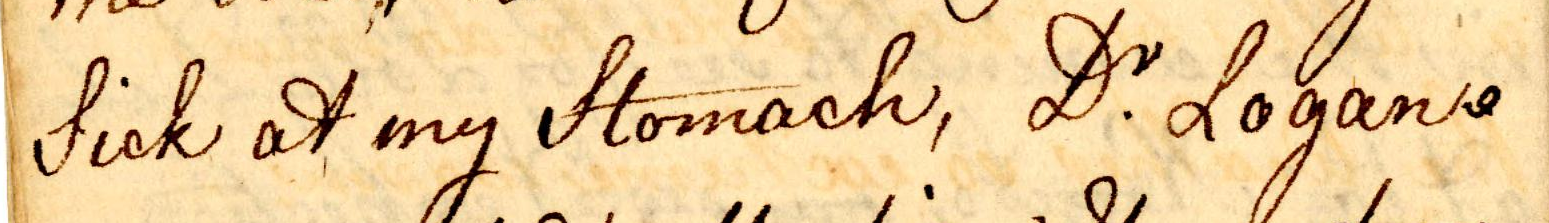Sick at my Stomach, D^r. Logans
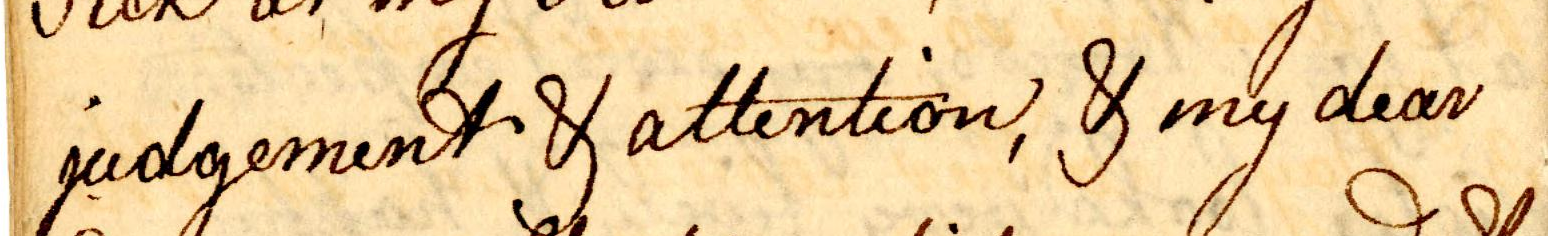judgement & attention, & my dear
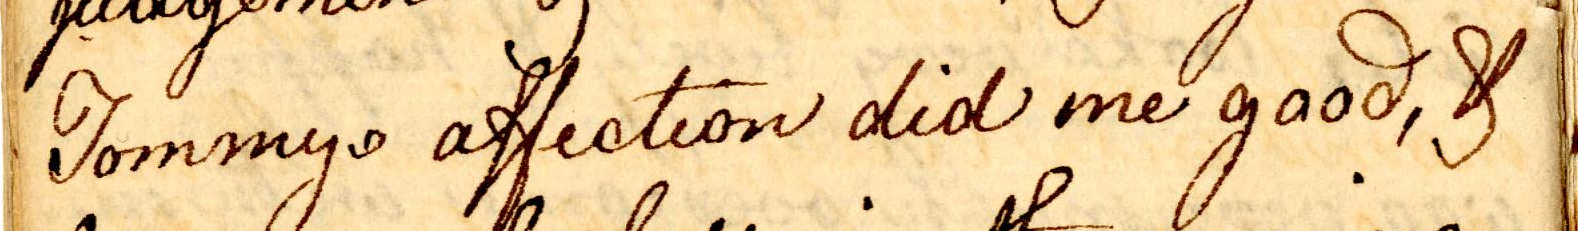Tommys affection did me good, &
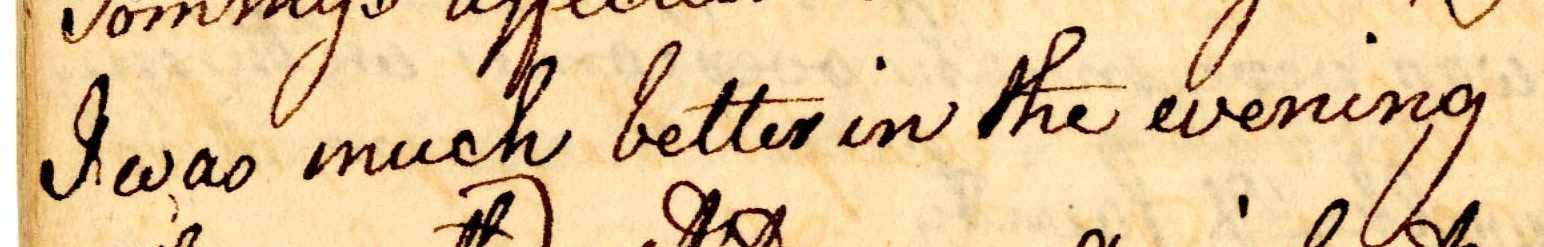I was much better in the evening
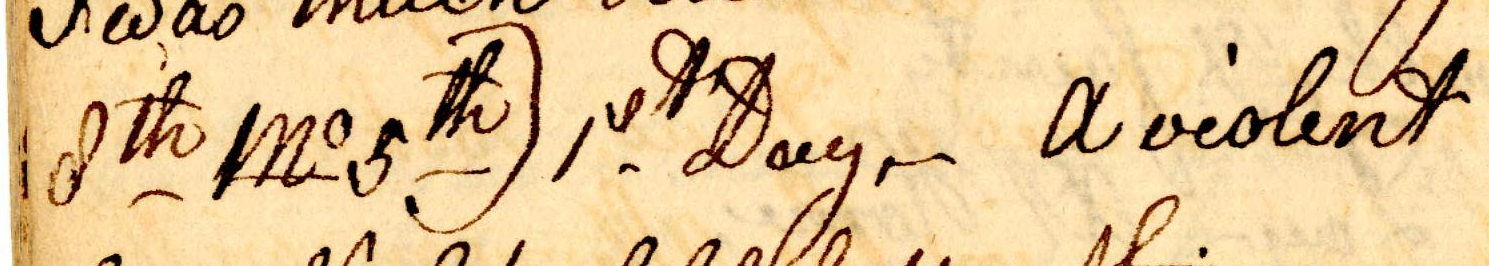8^th M^o 5^th) 1^st Day- A violent
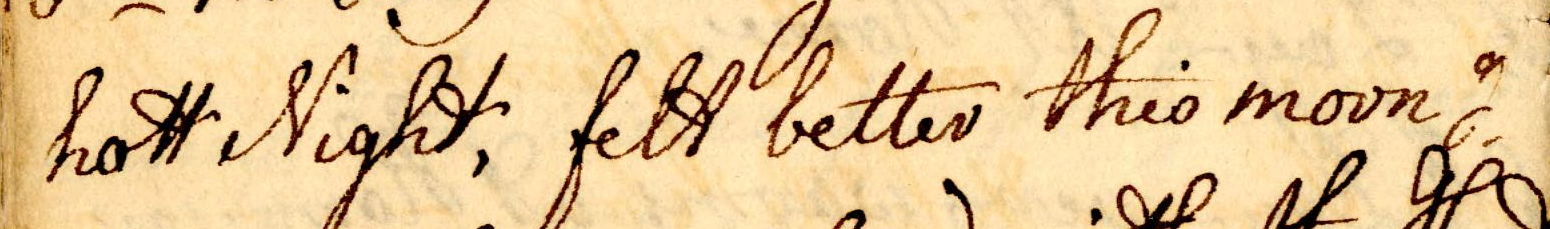hott Night, felt better this morn^g
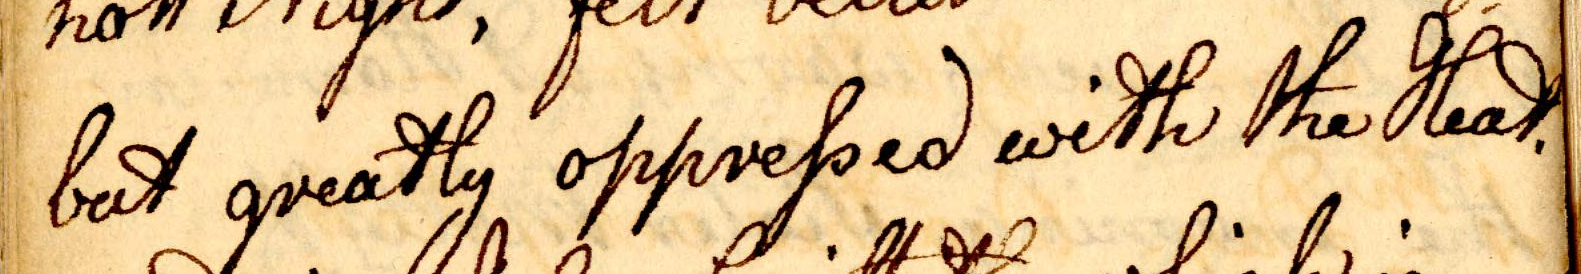but greatly oppressed with the Heat,
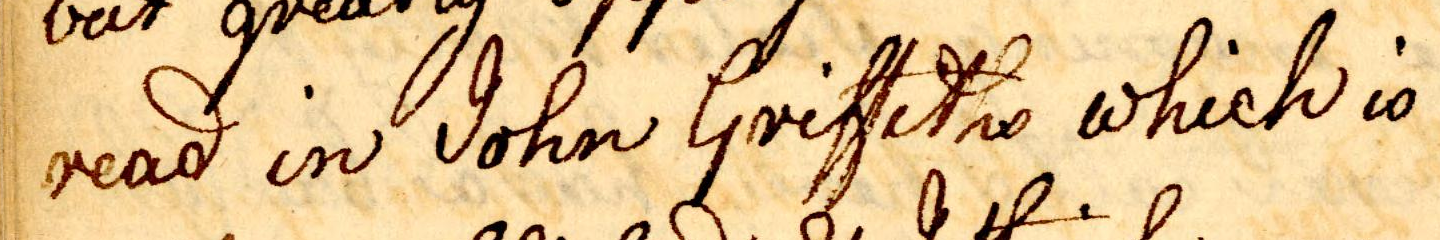read in John Griffiths which is
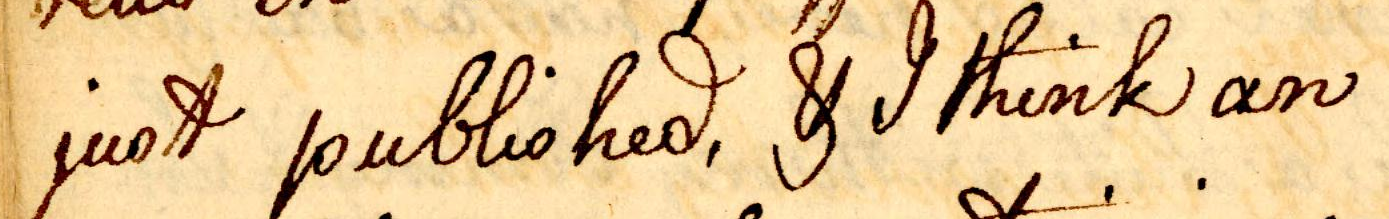just published, & I think an
